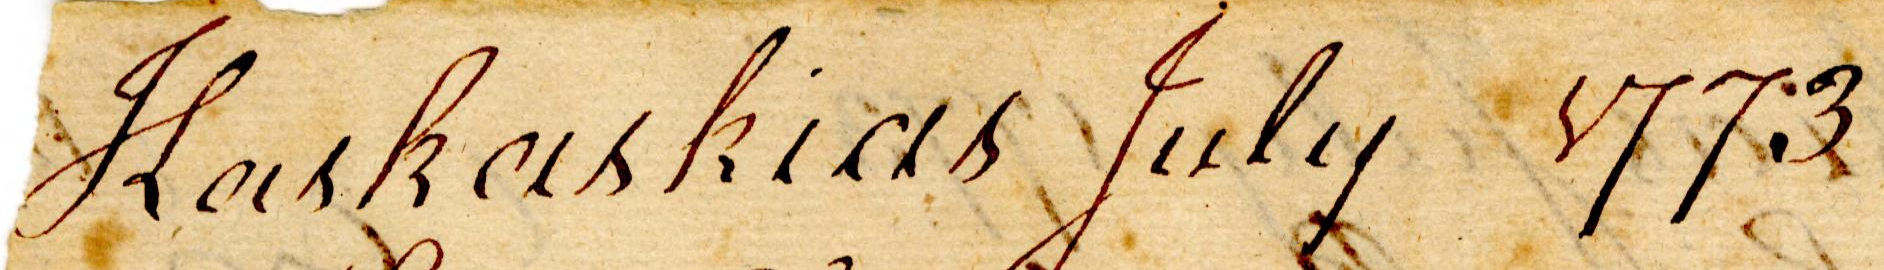Kaskaskias July 1773
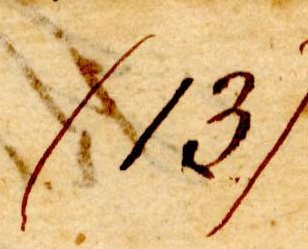(13)
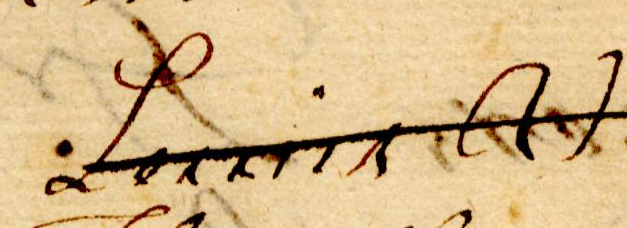[Lewis At]
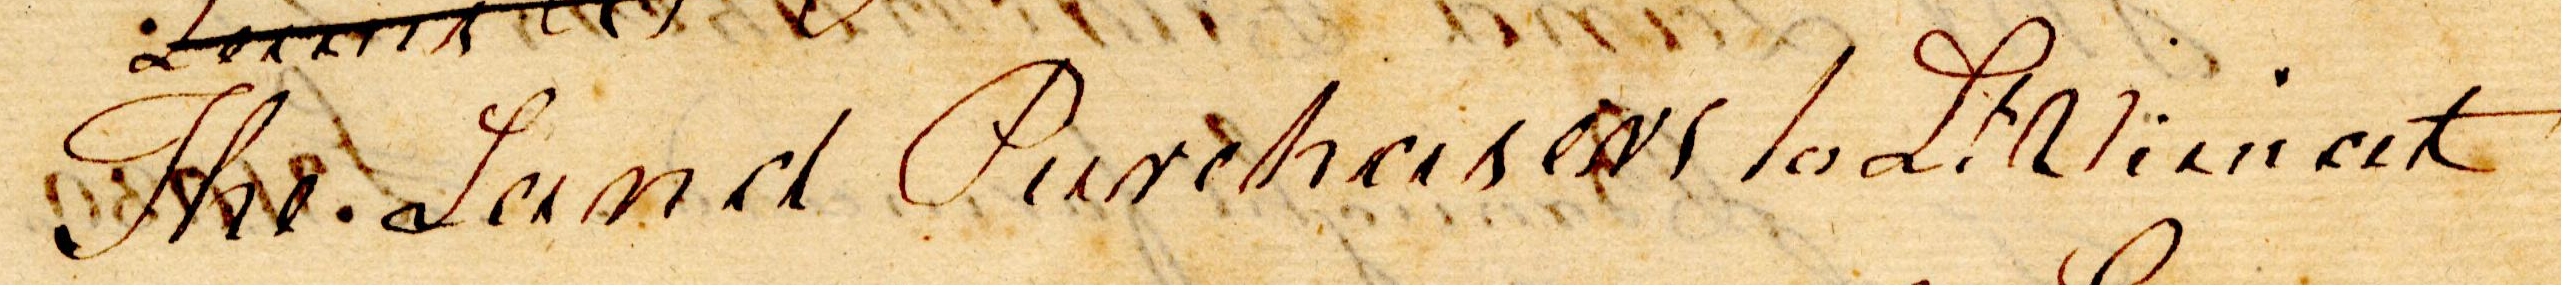The Land Purchases to L^t. Vinicet
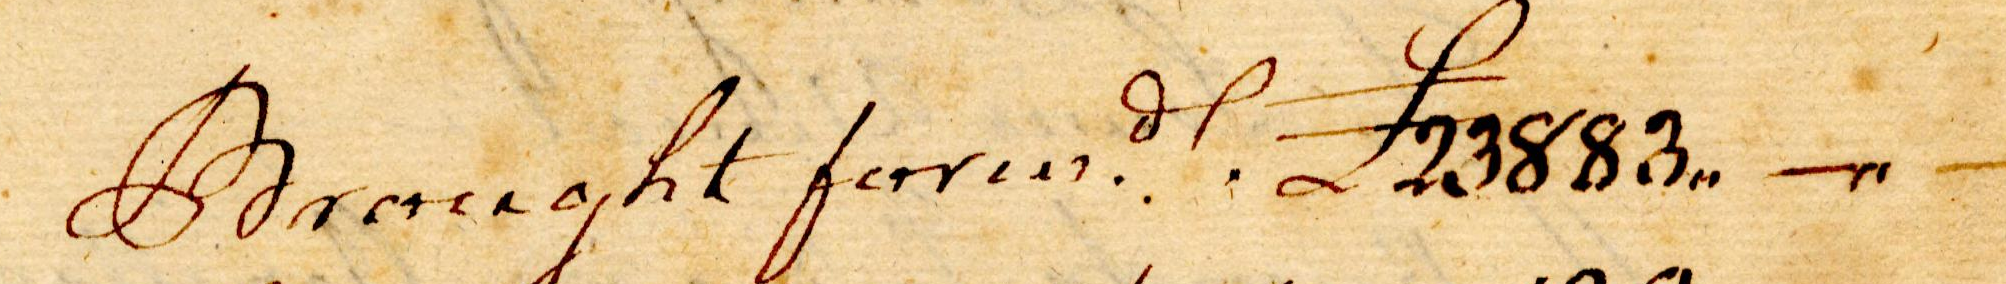Brought for us £23883.-.-
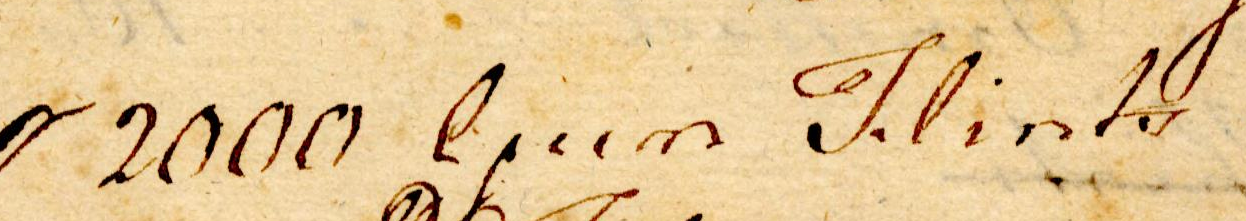2000 open Flints
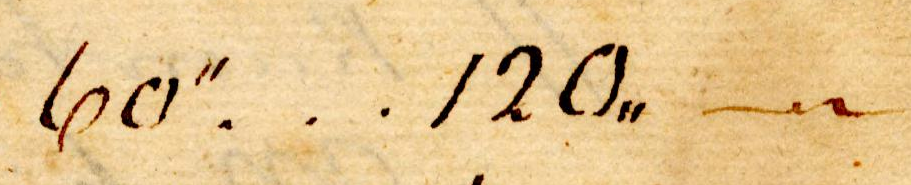60". . . 120.-
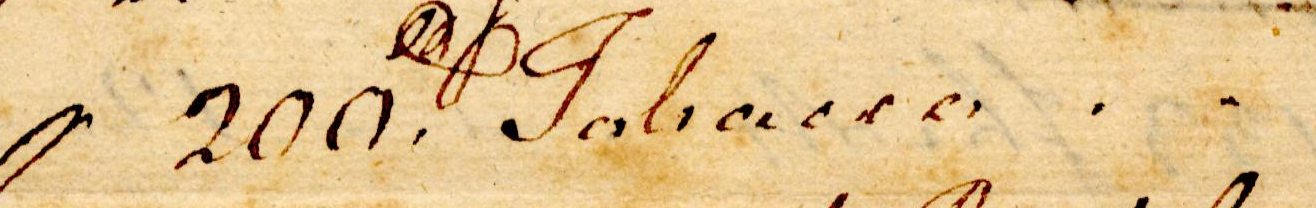200 Tobacco
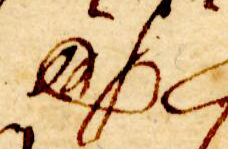@p
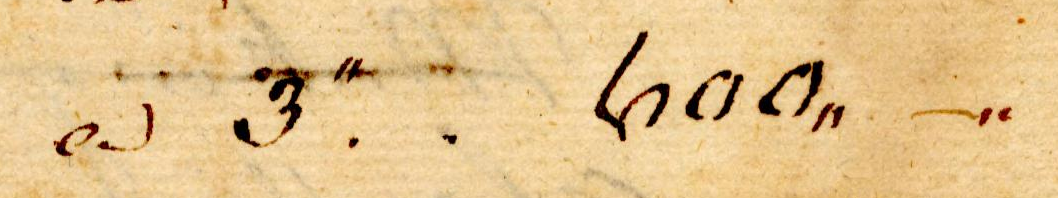@ 3'' . . 600.-.
